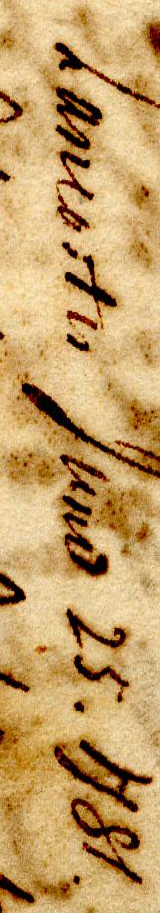Lancaster June 25. 1781
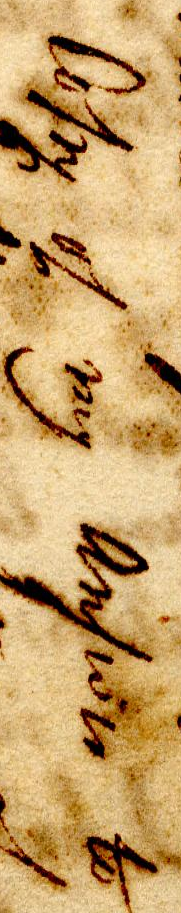Copy of my Answer to
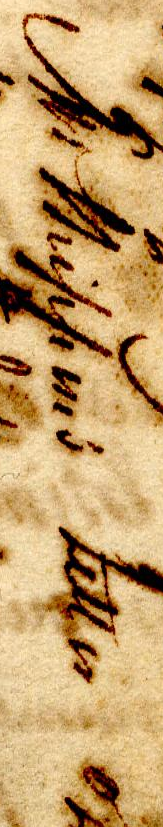M^r Shippen's Letter of
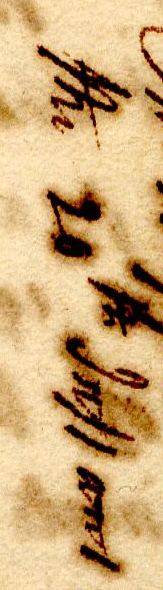the 20^th Instant
